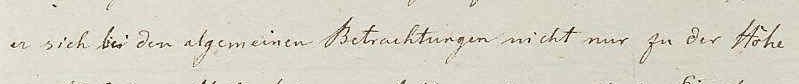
er sich bei den algemeinen Betrachtungen nicht nur zu der Höhe
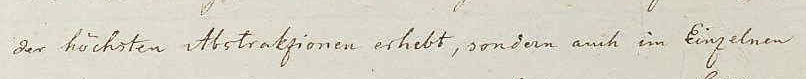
der höchsten Abstrakzionen erhebt, sondern auch im Einzelnen
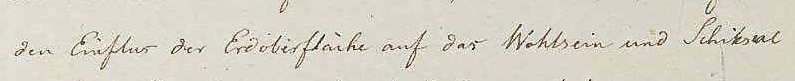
den Einflus der Erdoberfläche auf das Wohlsein und Schiksal
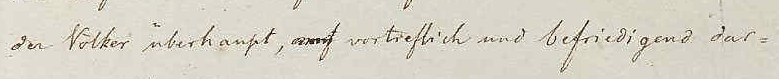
der Völker überhaupt, auf vortreflich und befriedigend dar-
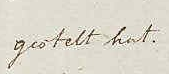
gestelt hat.
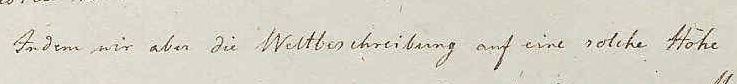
Indem wir aber die Weltbeschreibung auf eine solche Höhe
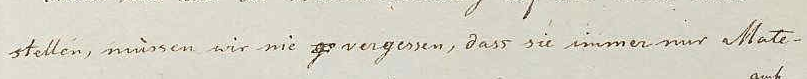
stellen, müssen wir nie ge vergessen, dass sie immer nur Mate-
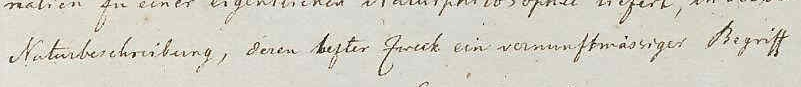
Naturbeschreibung, deren blezter Zweck ein vernunftmässiger Begriff
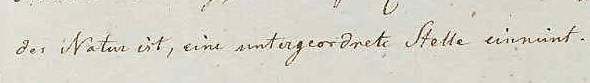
der Natur ist, eine untergeordnete Stelle einnimt.
